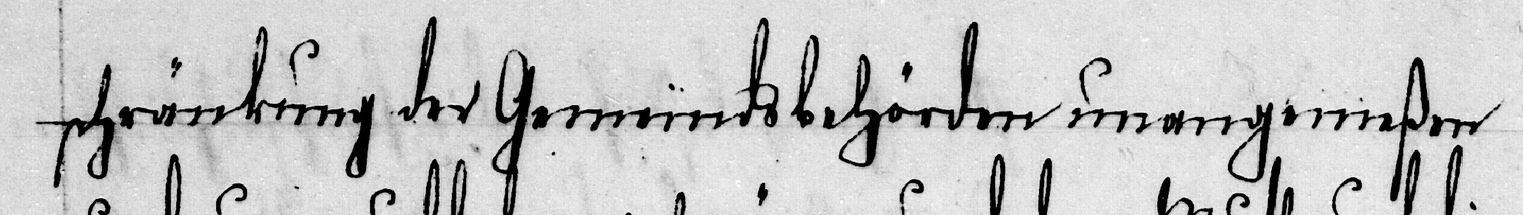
schränkung der Gemeindsbehörden unangemeßen
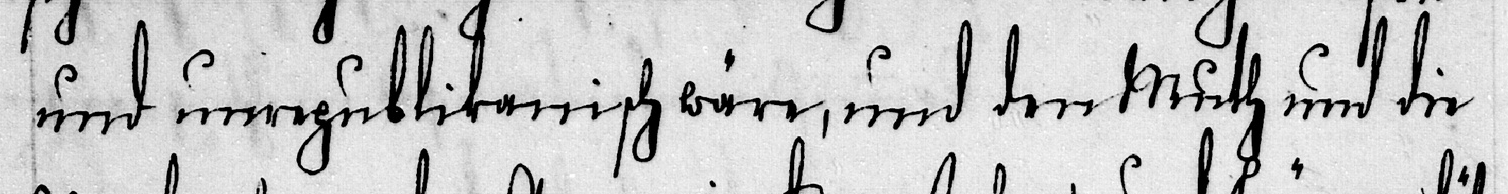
und unrepublikanisch wäre, und den Muth und die
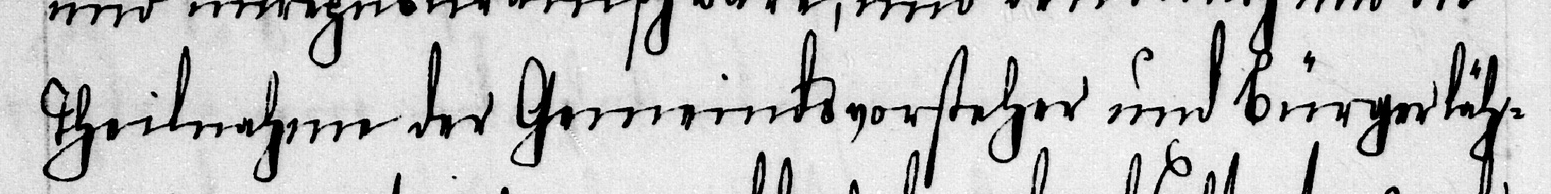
Theilnahme der Gemeindsvorsteher und Bürger läh¬
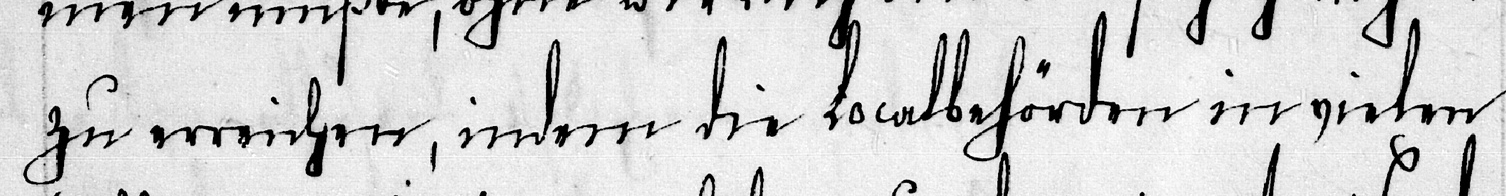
zu erreichen, indem die Localbehörden in vielen
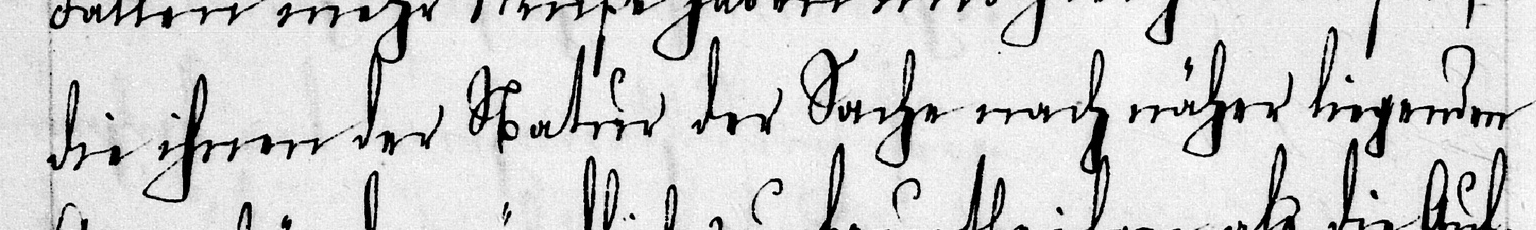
die ihnen der Natur der Sache nach näher liegenden
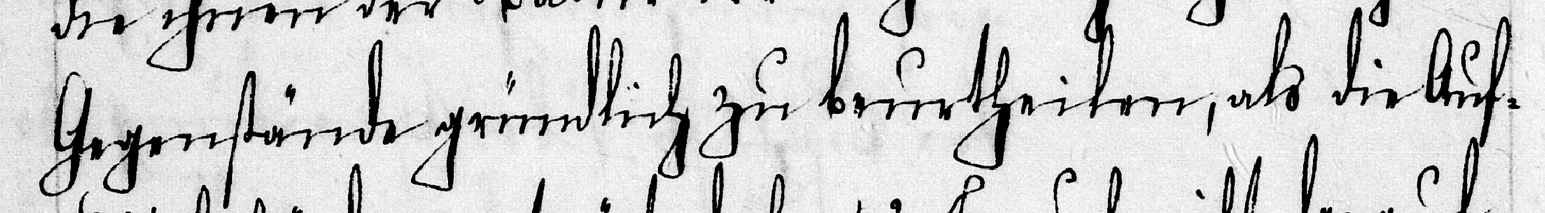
Gegenstände gründlich zu beurtheilen, als die Auf¬
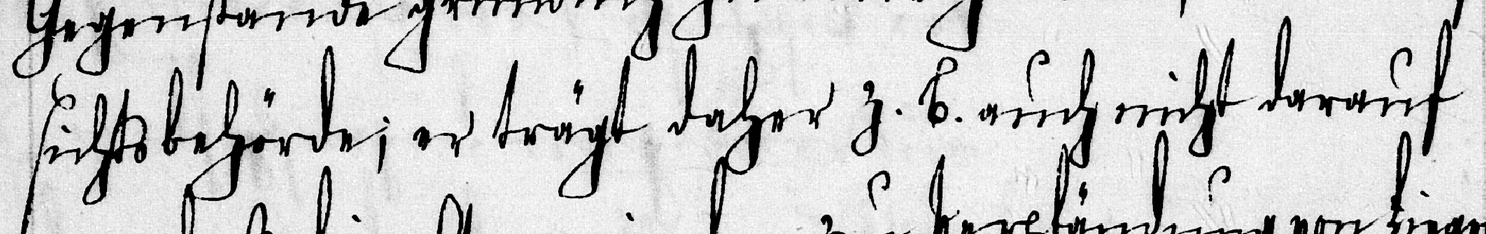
sichtsbehörde; er trägt daher z. B. auch nicht darauf
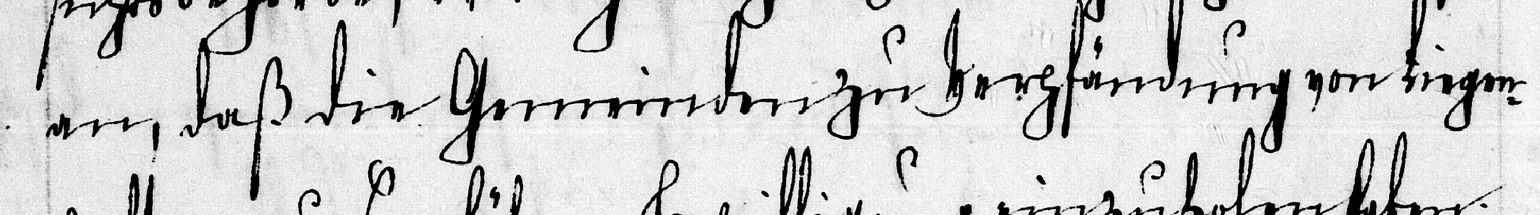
an, daß die Gemeinden zu Verpfändung von Liegen¬
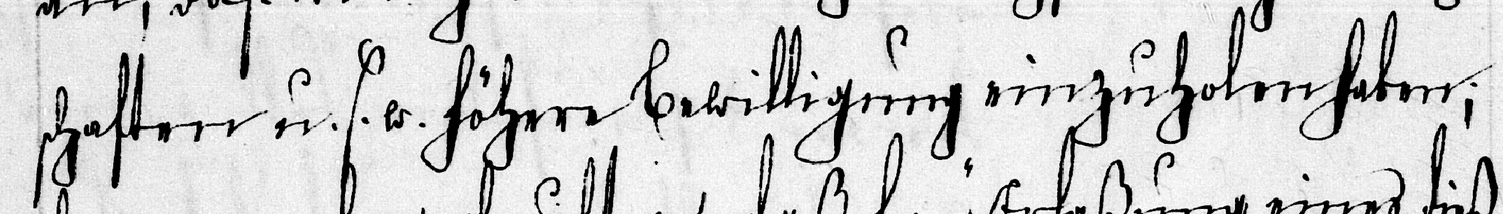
schaften u. s. w. höhere Bewilligung einzuholen haben;
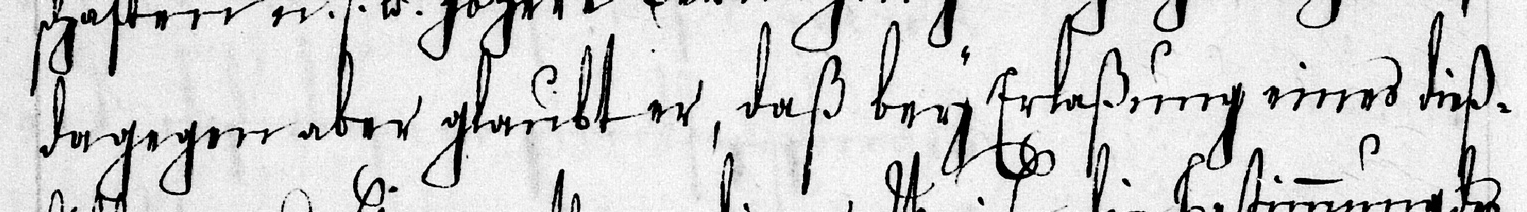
dagegen aber glaubt er, daß bey Erlaßung eines dieß¬
